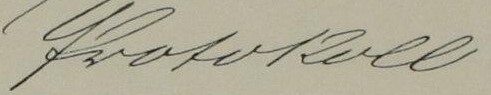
Protokoll
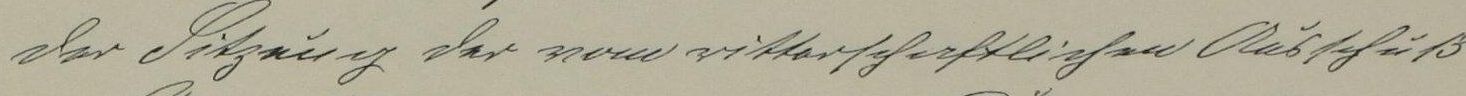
der Sitzung der vom ritterschaftlichen Ausschuß
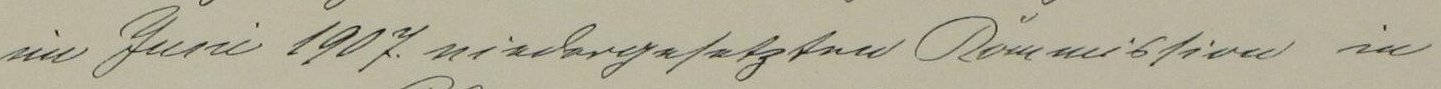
im Juni 1907. niedergesetzten Kommission in
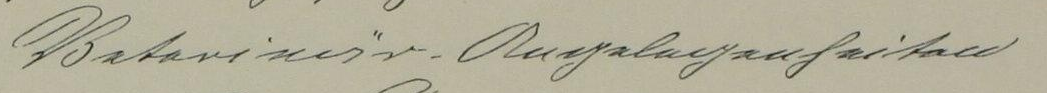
Veterinär-Angelegenheiten
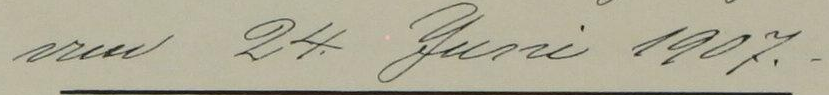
am 24. Juni 1907.
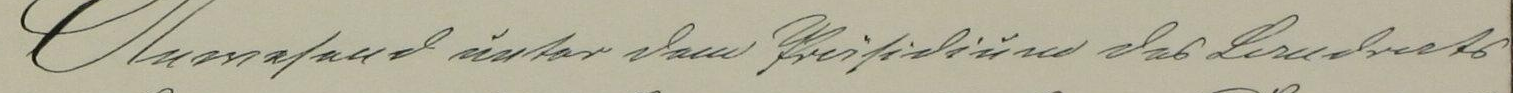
Anwesend unter dem Präsidium des Landrats
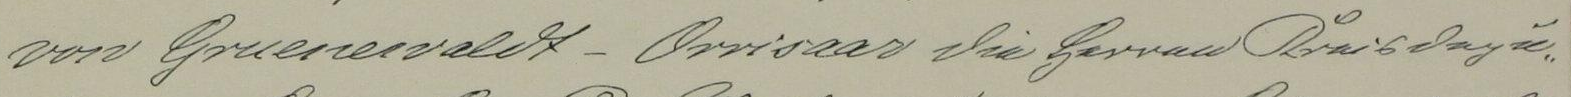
von Gruenewaldt-Orrisaar die Herren Kreisdepu-
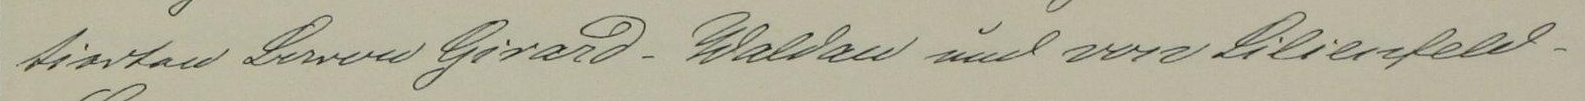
tierten Baron Girard-Waldau und von Lilienfeld-
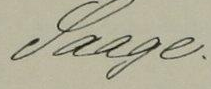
Saage.
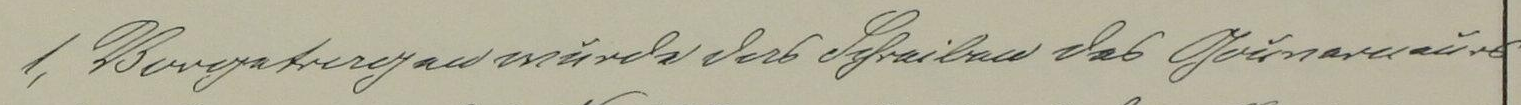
1. Vorgetragen wurde das Schreiben des Gouverneurs
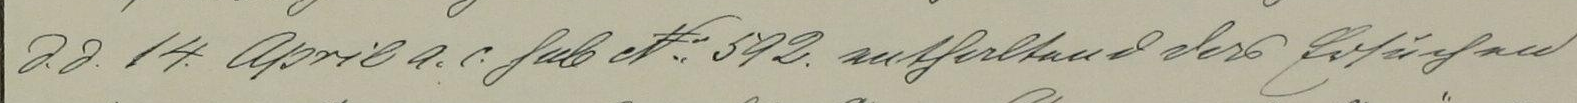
d.d. 14. April a.c. sub No. 592. enthaltend das Ersuchen
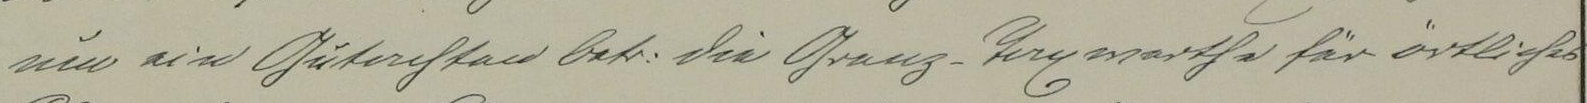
um ein Gutachten betr. die Grenz-Taxwerthe für örtliches
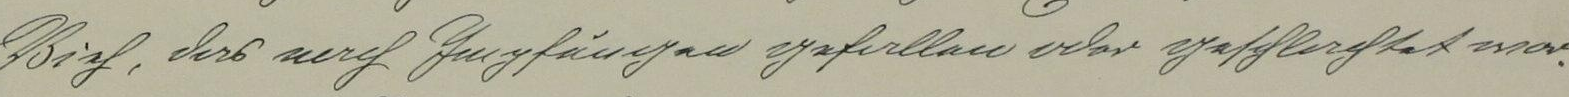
Vieh, das nach Impfungen gefallen oder geschlachtet wor-
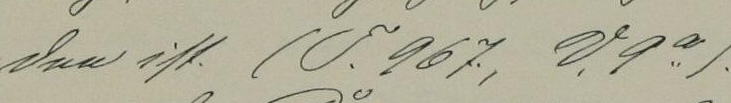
den ist. (T.967., V.9a).
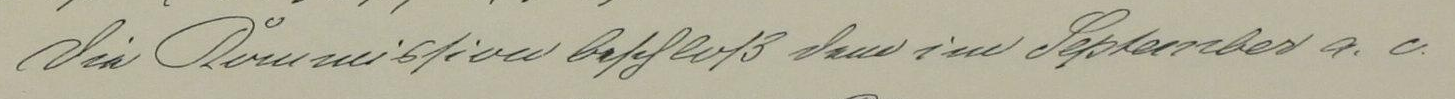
Die Kommission beschloß dem im September a.c.
